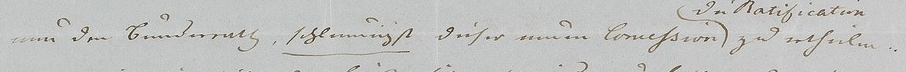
nun den Bundesrath, schleunigst dieser neuen Concession die Ratification zu
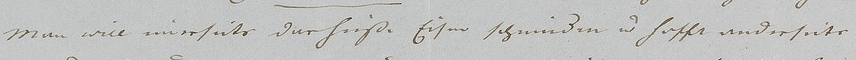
Man will einerseits das heiße Eisen schmieden u hofft anderseits
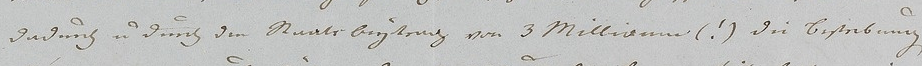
dadurch u durch den Staatsbeytrag von 3 Millionen (!) die Bestrebungen
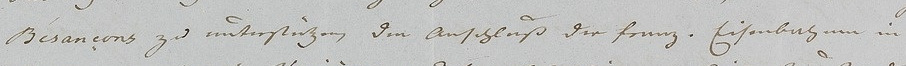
Besançons zu unterstützen, den Anschluß der franz. Eisenbahnen in
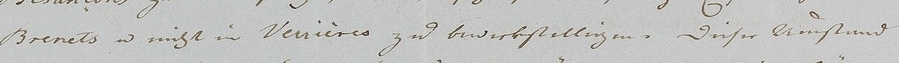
Brenets u nicht in Verrières zu bewerkstelligen. Dieser Umstand
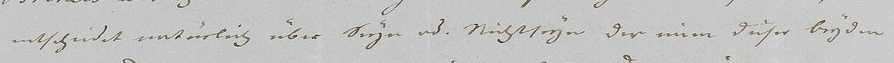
entscheidet natürlich über Seyn od. Nichtseyn der einen dieser beyden
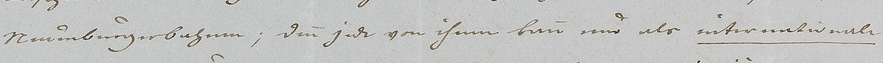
Neuenburgerbahnen; denn jede von ihnen kann nur als internationale
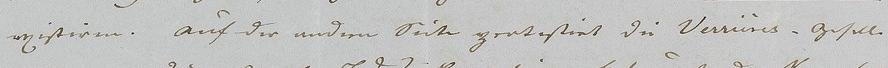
existiren. Auf der andern Seite protestirt die Verrières-Gesell-
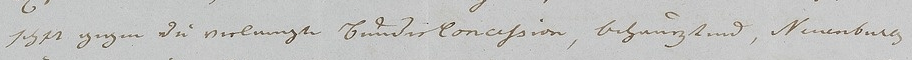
schaft gegen die verlangte Bundes Concession, behauptend, Neuenburg
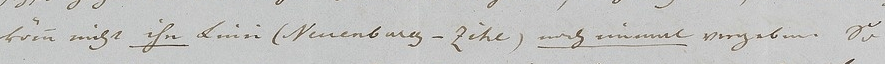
könne nicht ihre Linie (Neuenburg –Zihl ) noch einmal vergeben. So
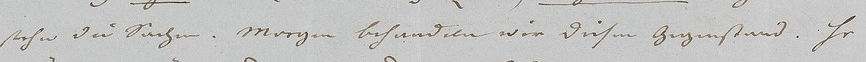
stehn die Sachen. Morgen behandeln wir diesen Gegenstand. Hr
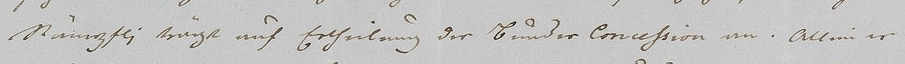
Stämpfli trägt auf Ertheilung der Bundes Concession an. Allein es
